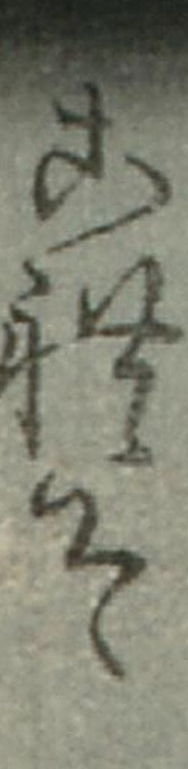これそ
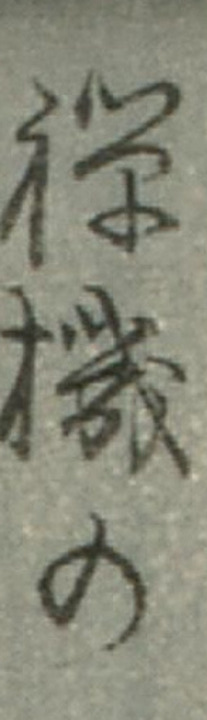禅機の
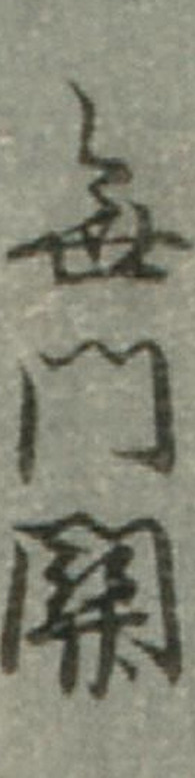無門関
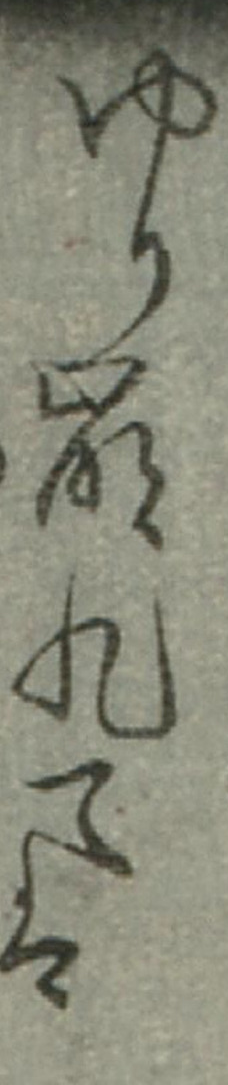ゆり崩れては
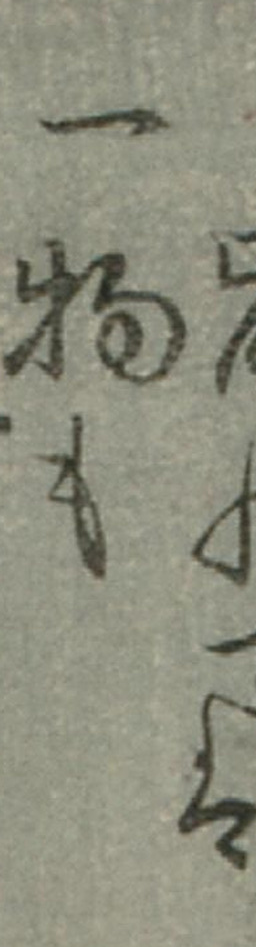一物も
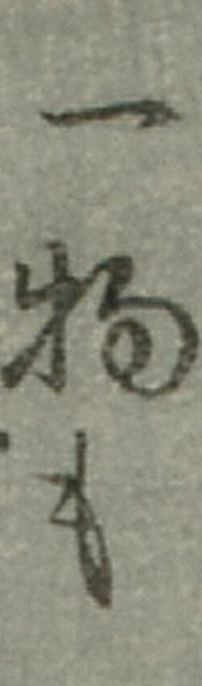一物も
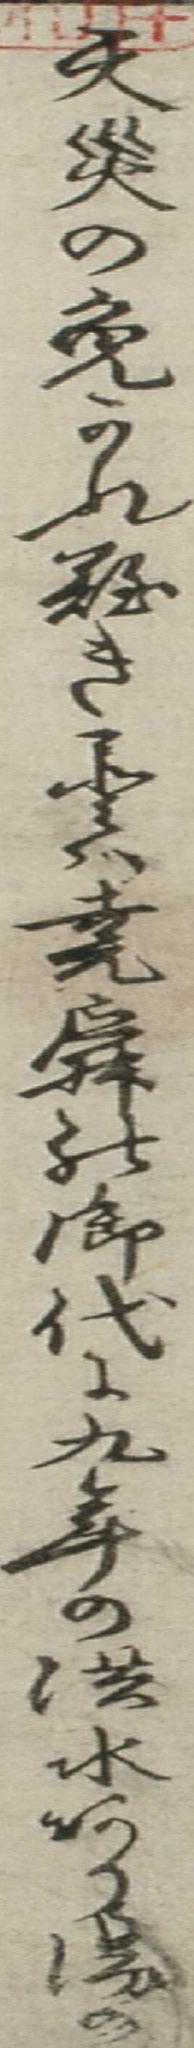天災の免かれ難きことは堯舜の御代に九年の洪水あり湯の
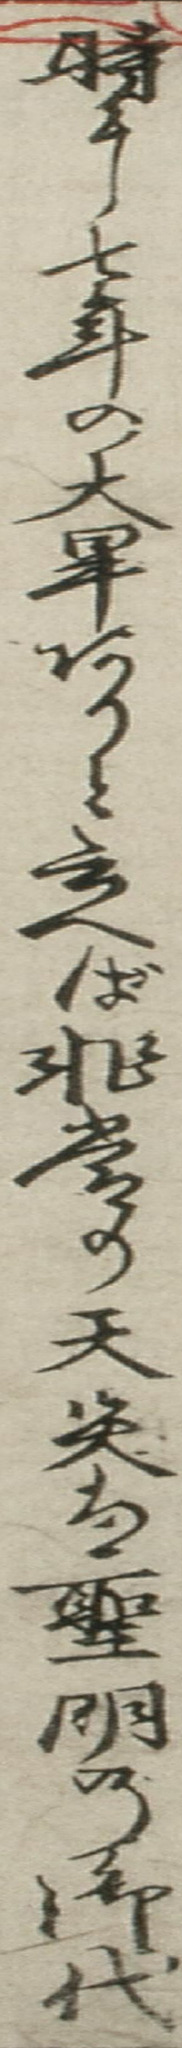時に七年の大旱ありと云へば非常の天災は聖明の御代
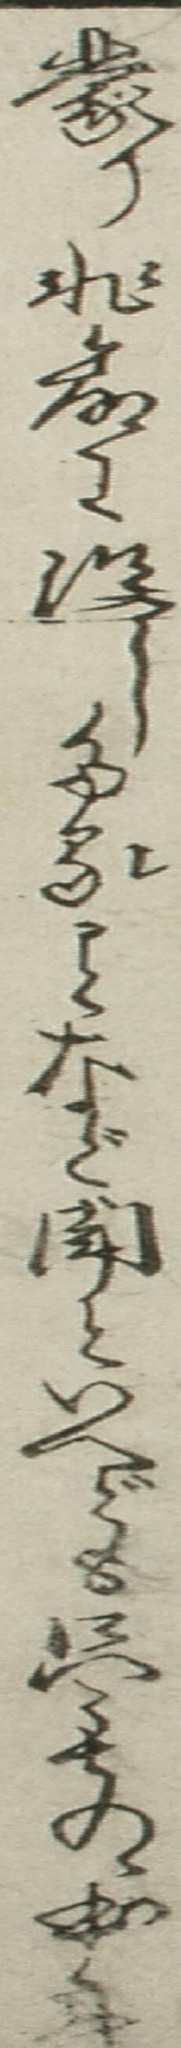蒙り非常に没したることなど聞といへども只ものゝ本年
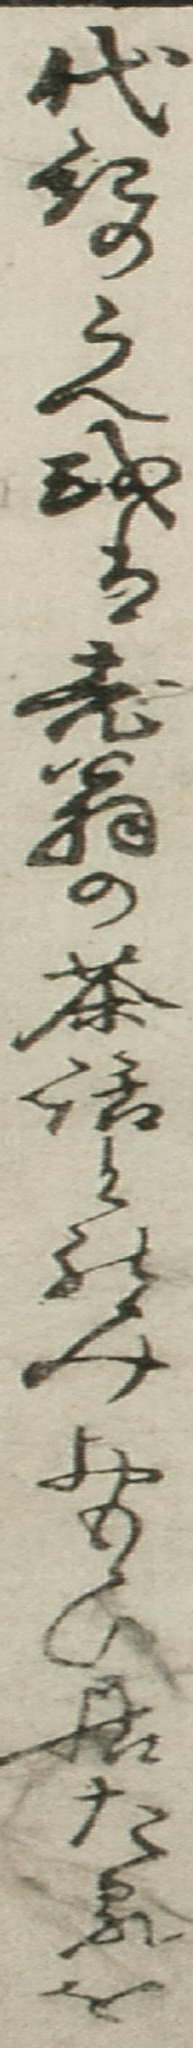代紀のうへ或は老翁の茶話とのみおもひ居たるを近
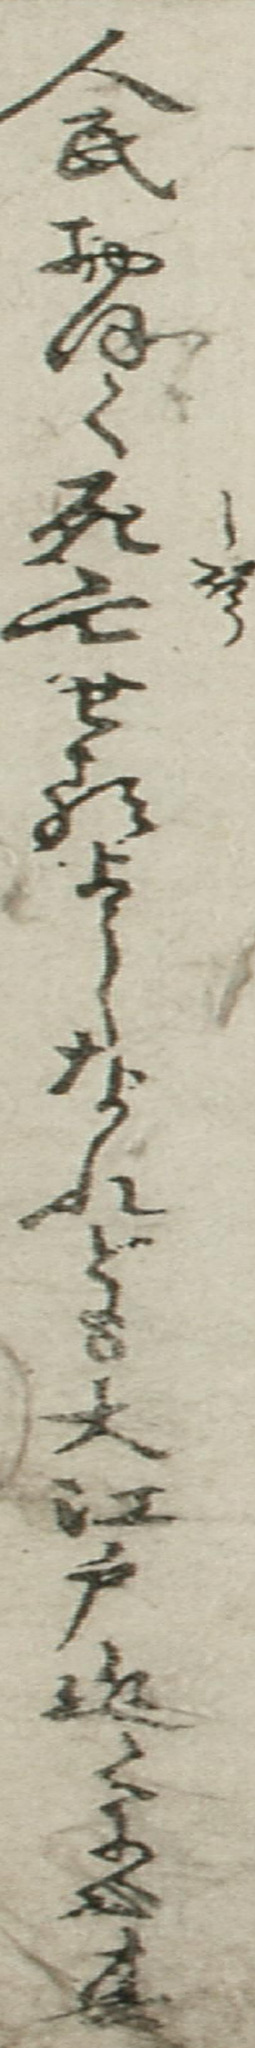人民おほく死亡せるよしなれども大江戸近くには其

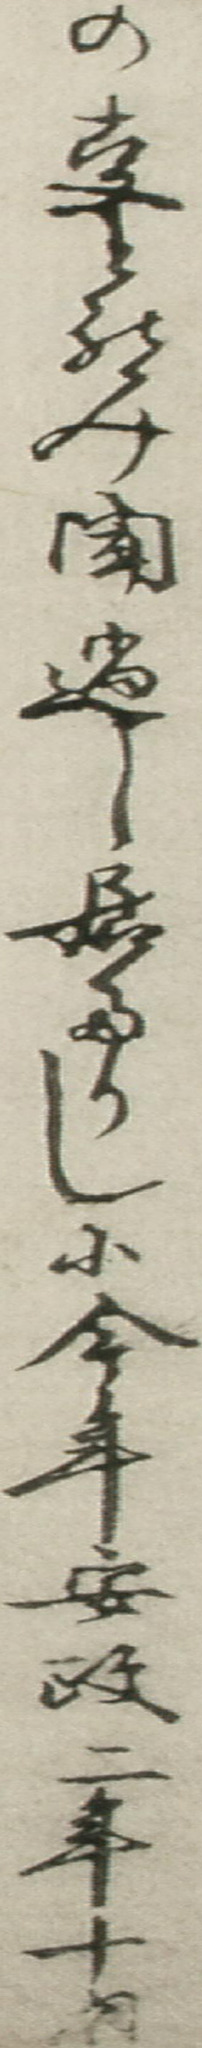の事とのみ聞過し居たりしに今年安政二年十月
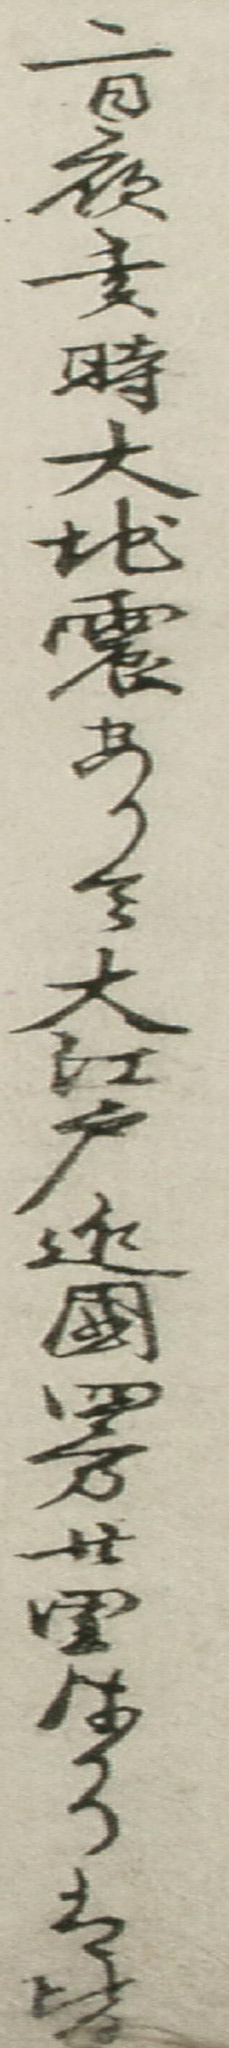二日夜亥時大地震ありて大江戸近国四方廿里はかりは皆
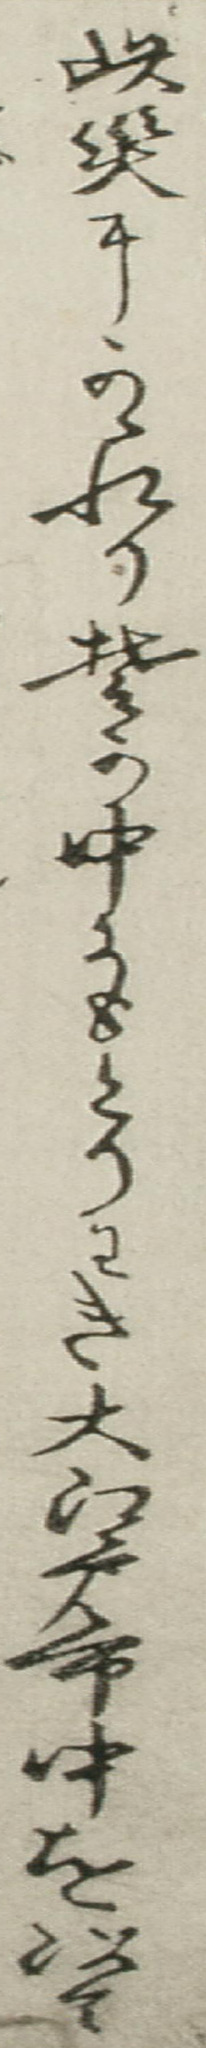此災にかゝれりそか中にもとりわき大江戸市中を以て
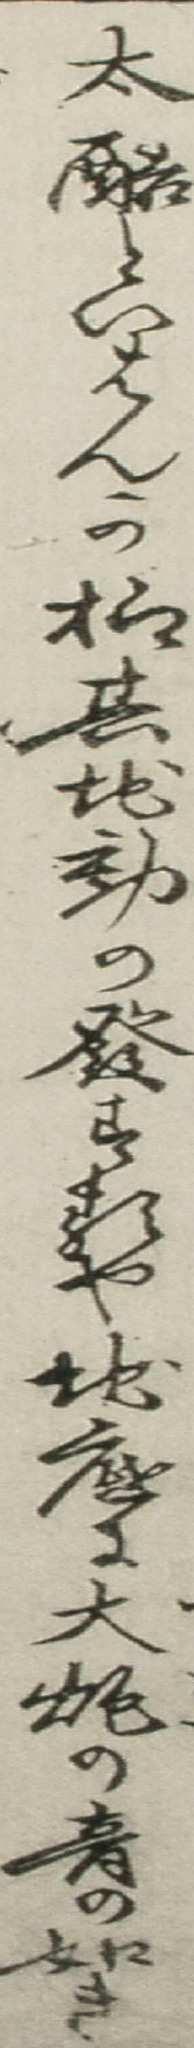太酷といはんか抑其地動の発するや地底に大炮の音の如き
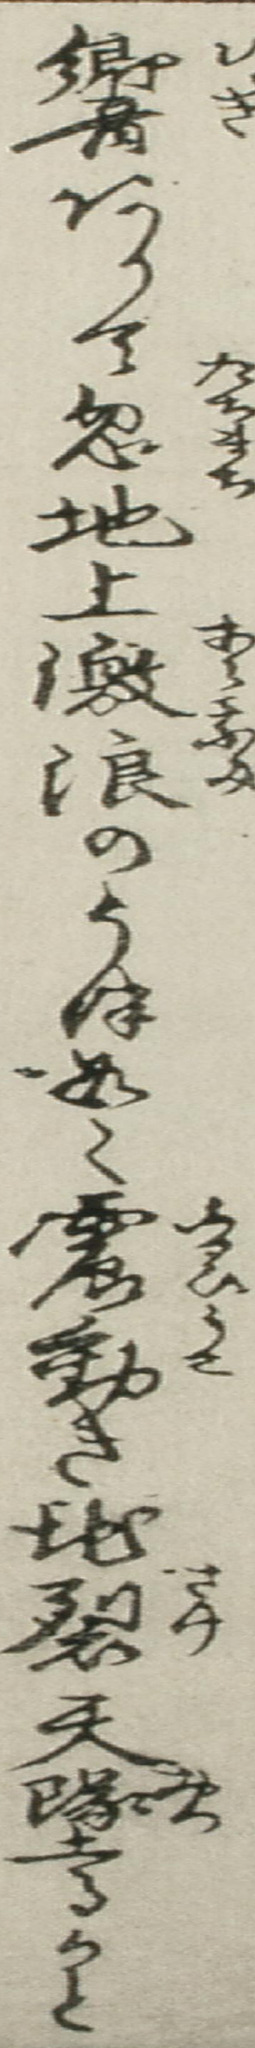響ありて忽地上激浪のうつ如く震動き地裂天墜るかと
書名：安政見聞誌　上
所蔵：東京大学地震研究所図書室 Earthquake Research Institute Library, The University of Tokyo, JAPAN
